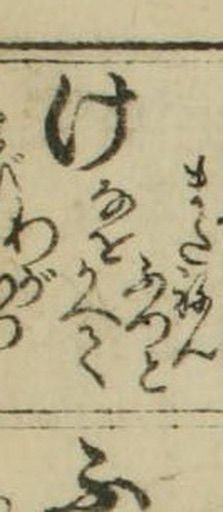なをかへて
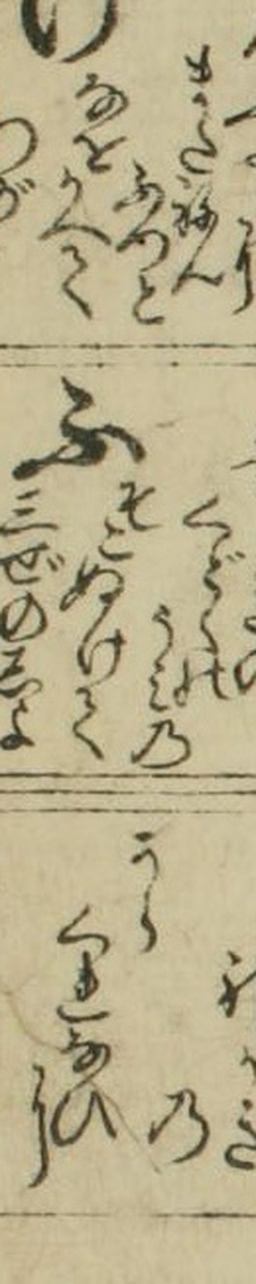なをかへて
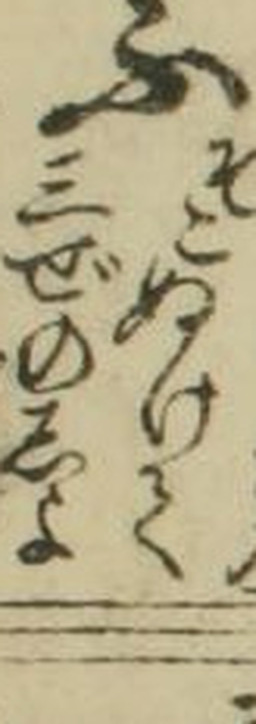三ぜのしよ
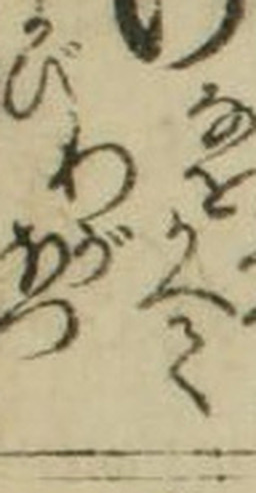わが物
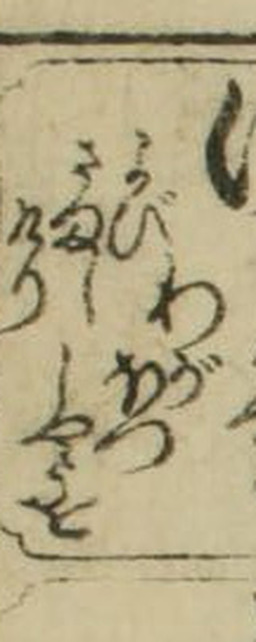しやうを

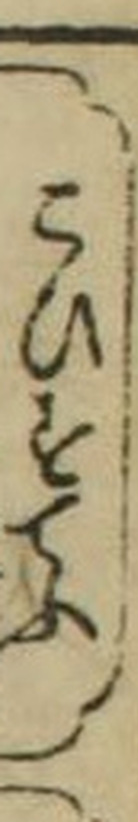こひすてふ
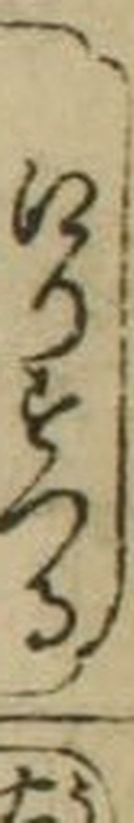すつる
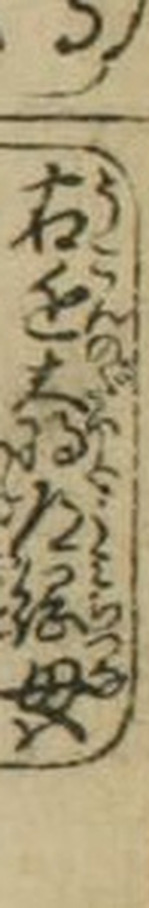右近大将道綱母は
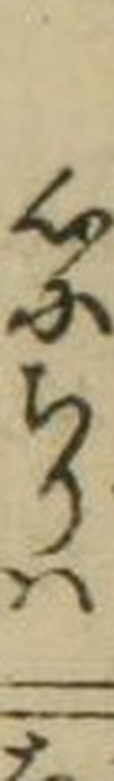心にちりは
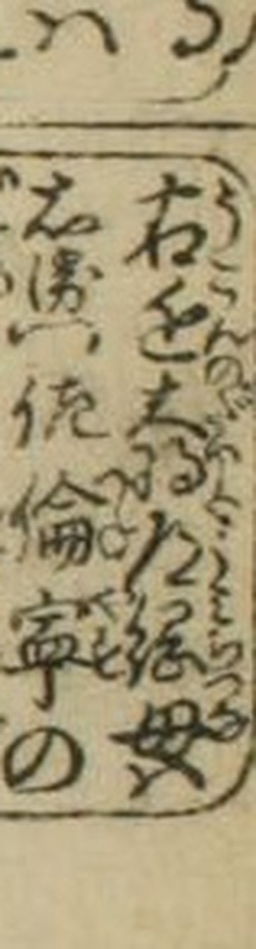右衛門佐倫寧の
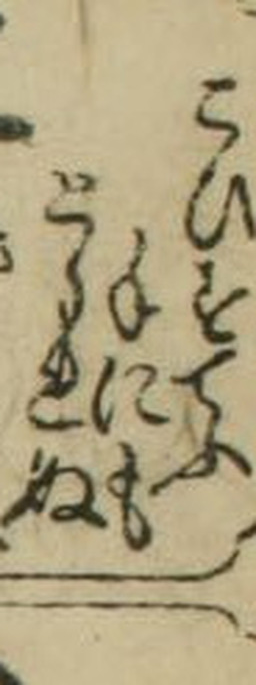とられぬ
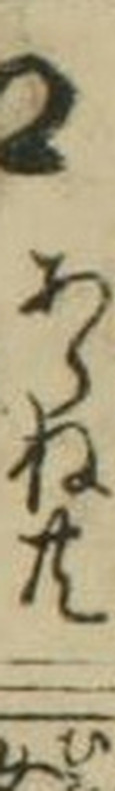あらね共
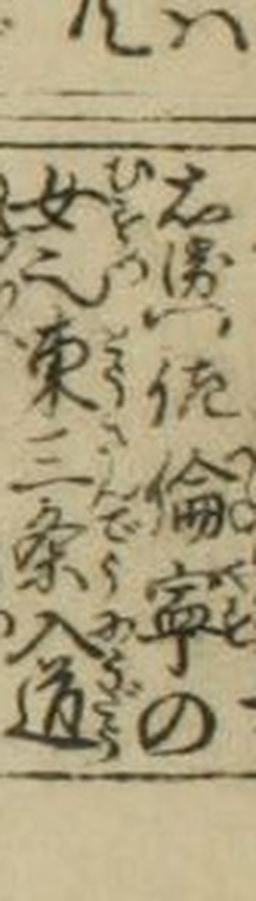女也東三条入道
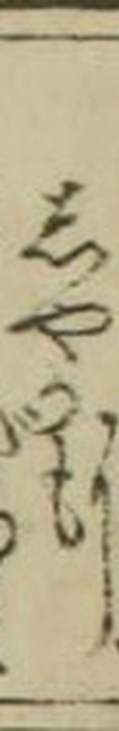しやかも
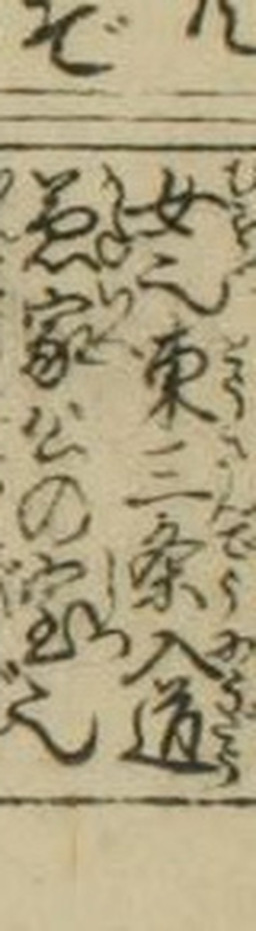兼家公の室也
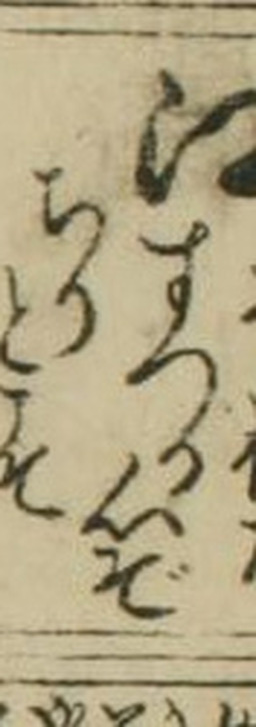ちりとこそ
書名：女源氏教訓鑑
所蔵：東京学芸大学附属図書館
